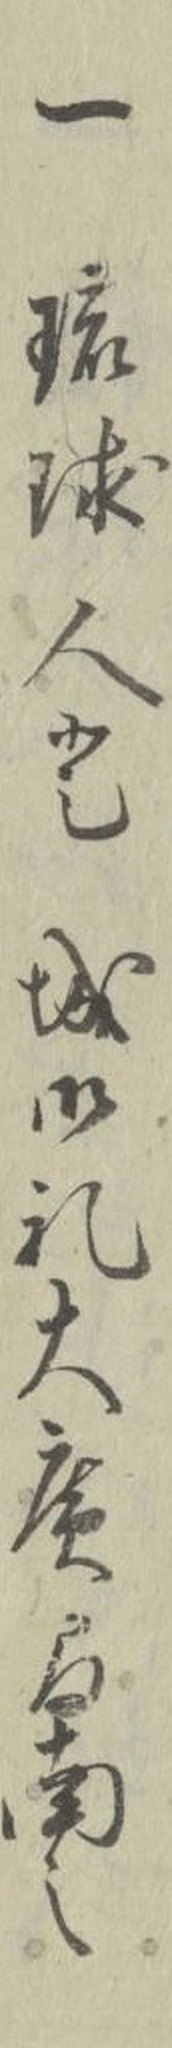一琉球人登城御礼大広間南之
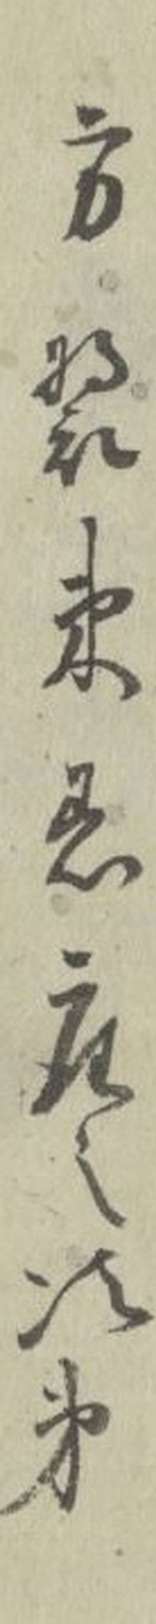方装束着座之次第

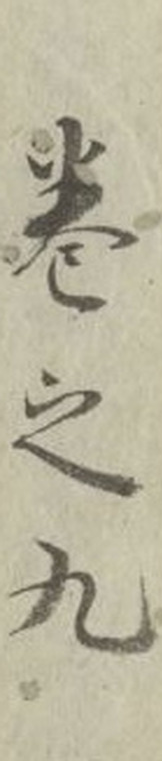巻之九
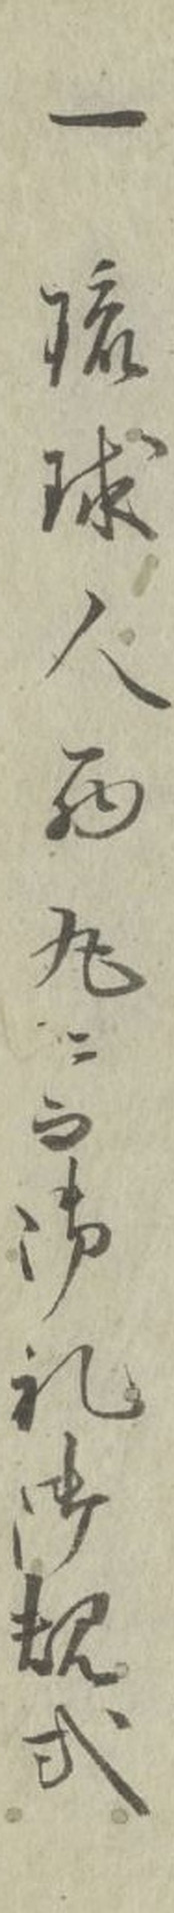一琉球人西丸に而御礼御規式
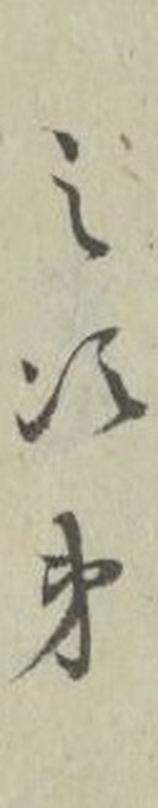之次第
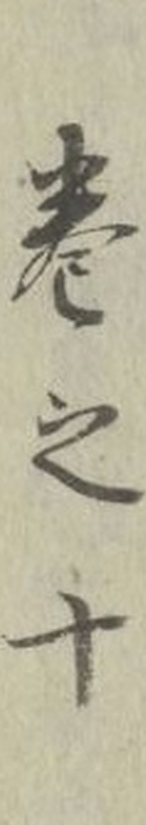巻之十
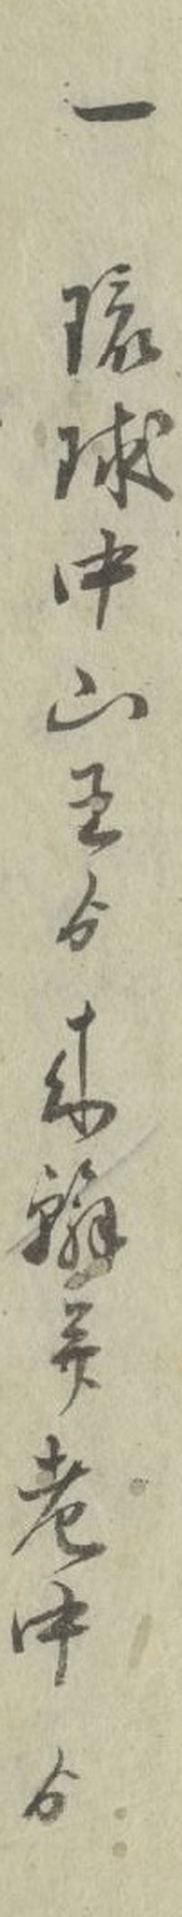一琉球中山王ゟ来翰幷老中ゟ
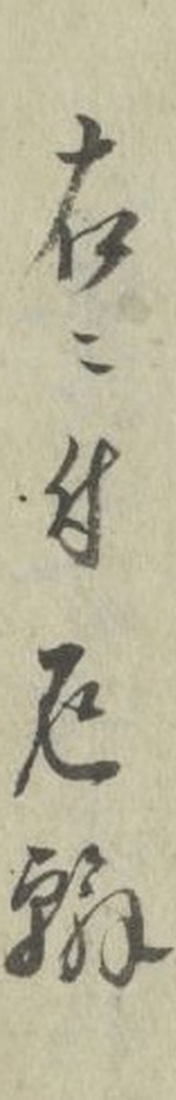右に付返翰
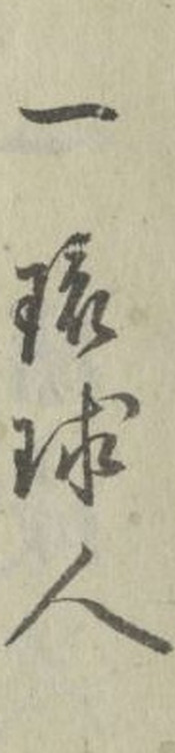一琉球人
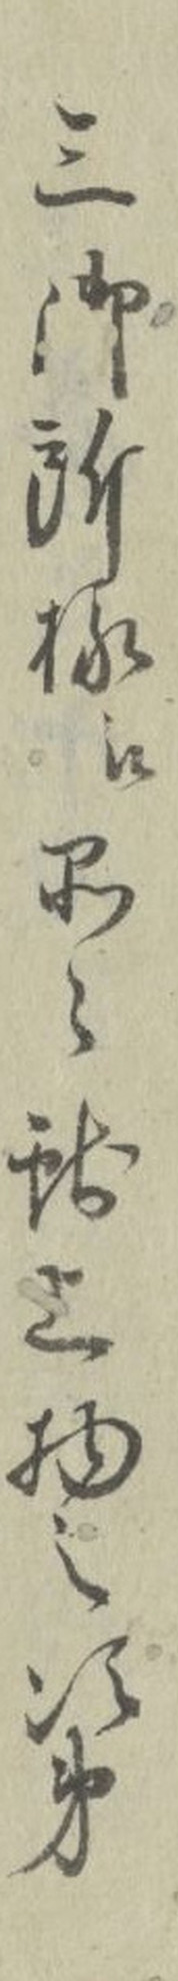三御所様え品々献上物之次第
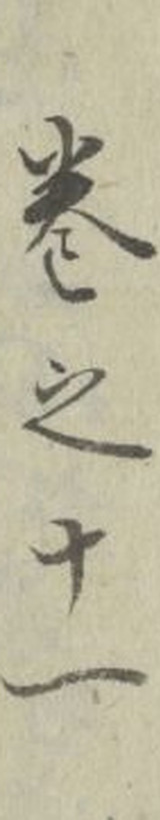巻之十一
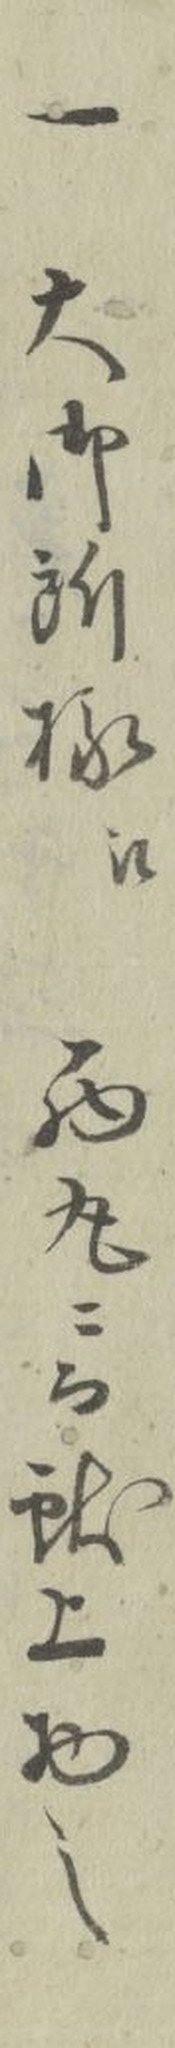一大御所様え西丸に而献上物之
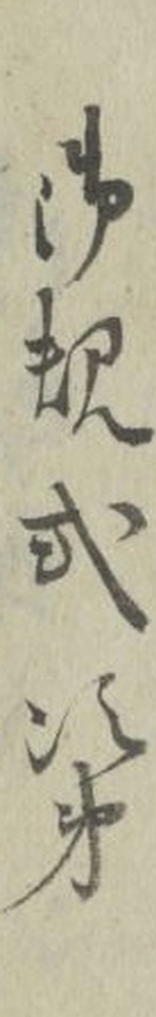御規式次第
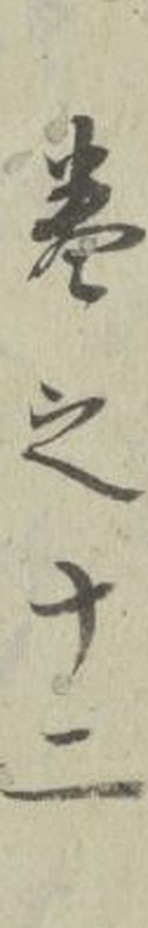巻之十二

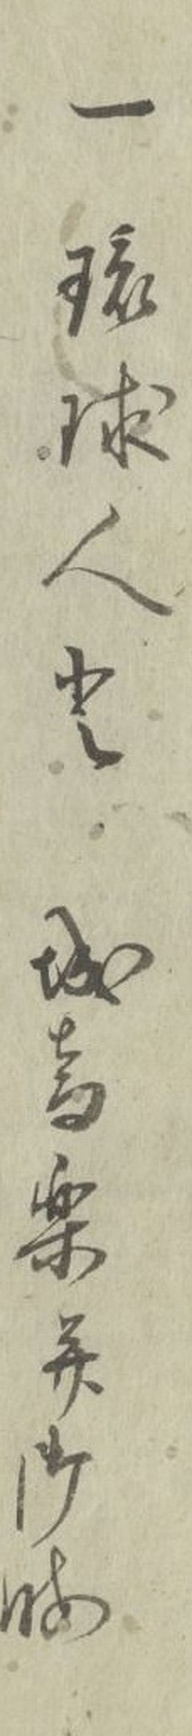一琉球人登城音楽幷御暇
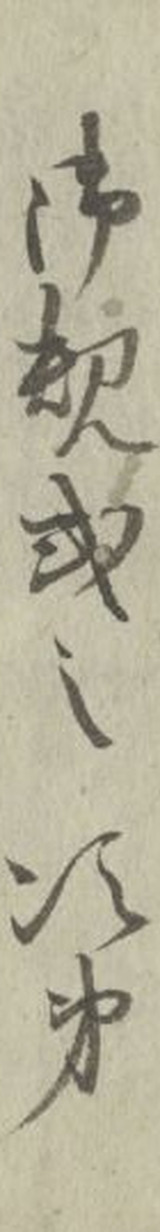御規式之次第
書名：琉球来朝記 自一至七
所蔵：University of the Ryukyus Library
